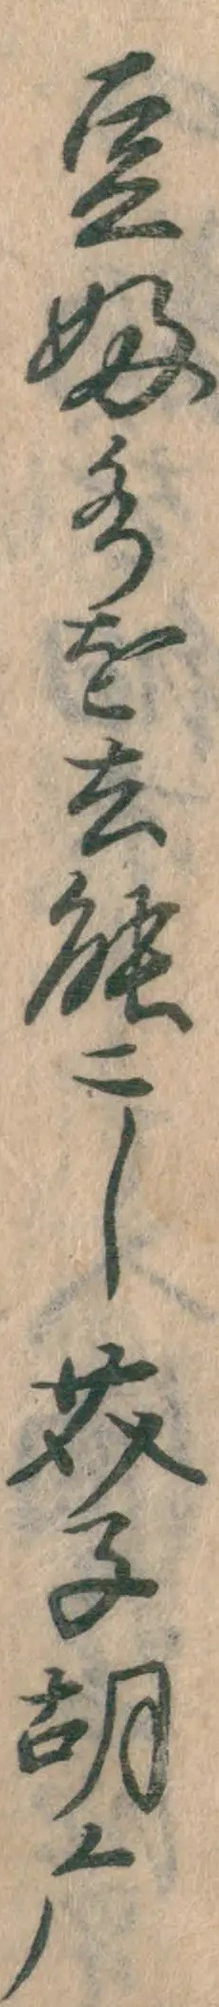豆ふ水を去能こし芥子胡麻

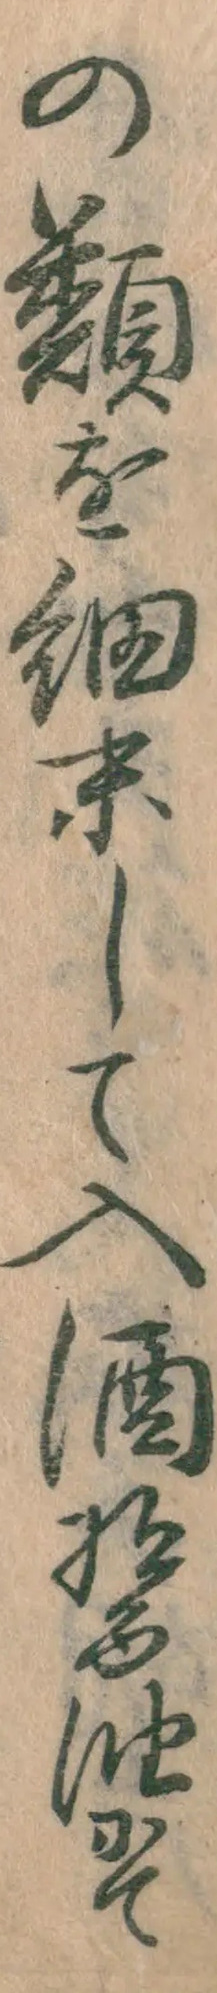の類を細末して入酒醤油にて
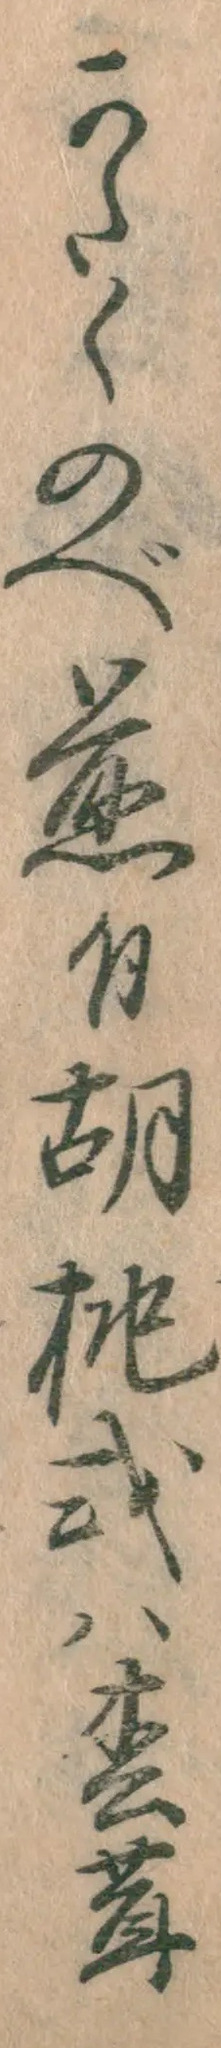かたくのべ煎付胡麻或は松茸
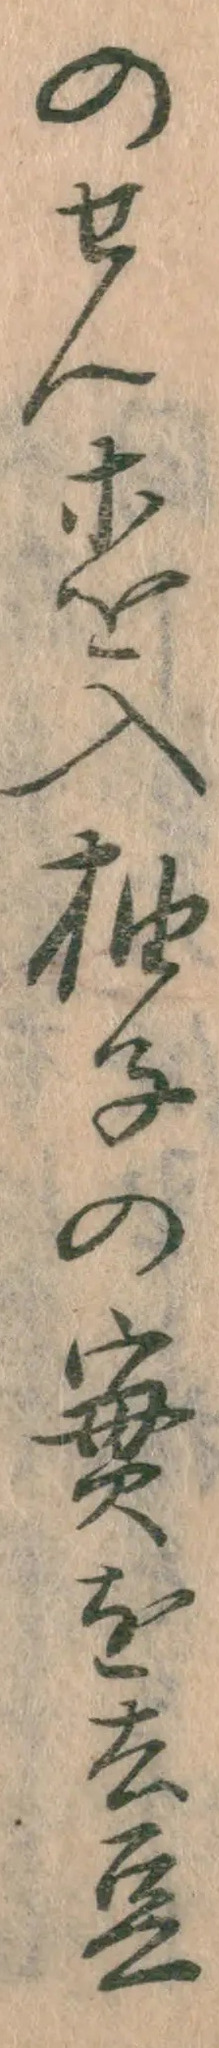のせん等を入柚子の実を去豆
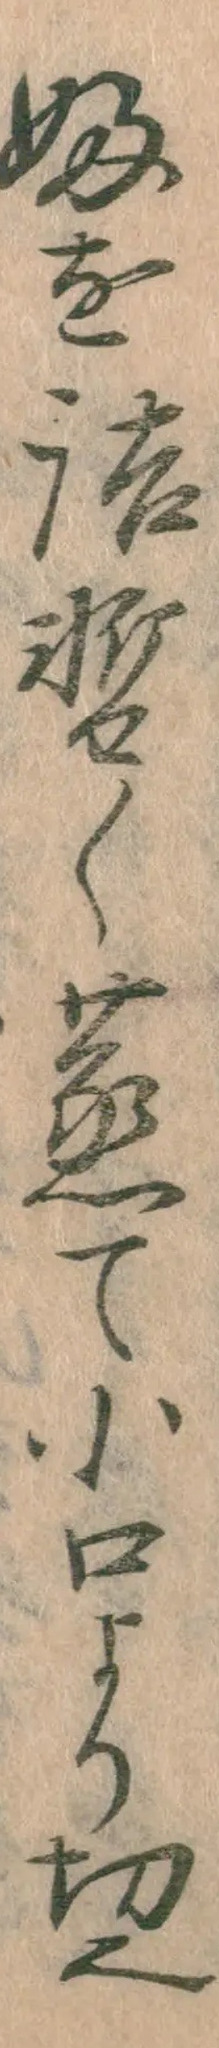ふを詰暫く蒸て小口より切也
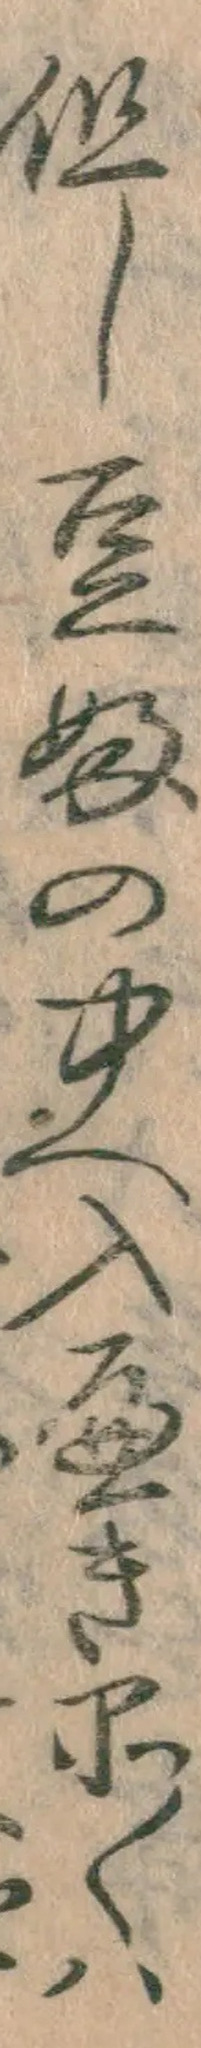但し豆ふの中へ入へき品〳〵は
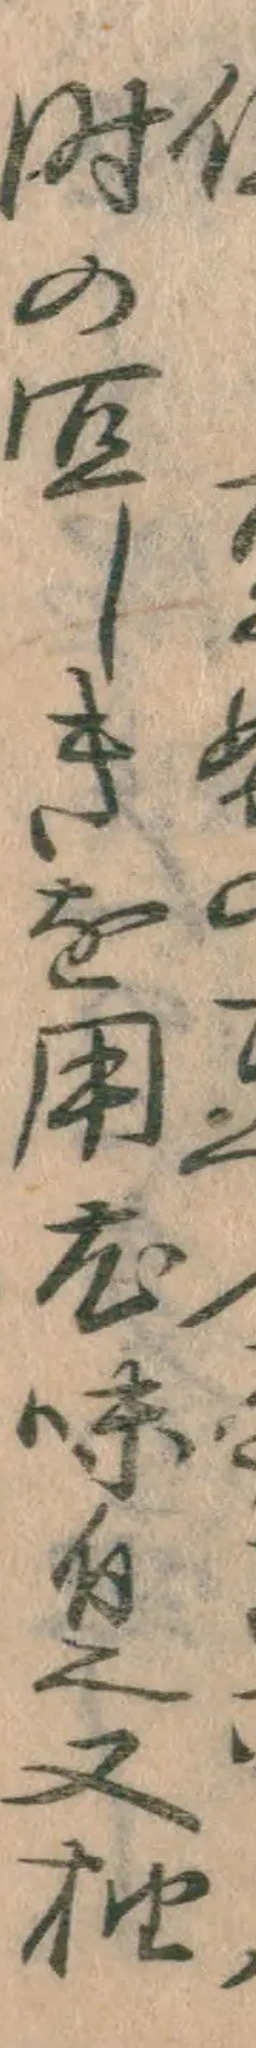時の宜しきを用尤味付也又柚
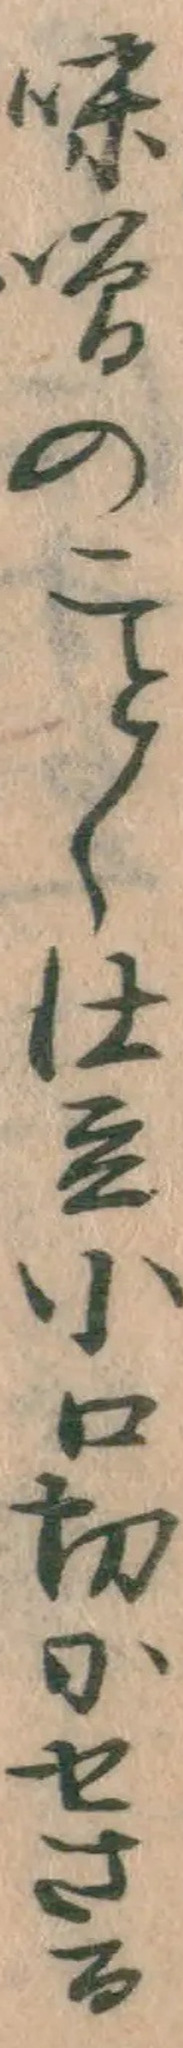味噌のことく仕立小口切にせさる
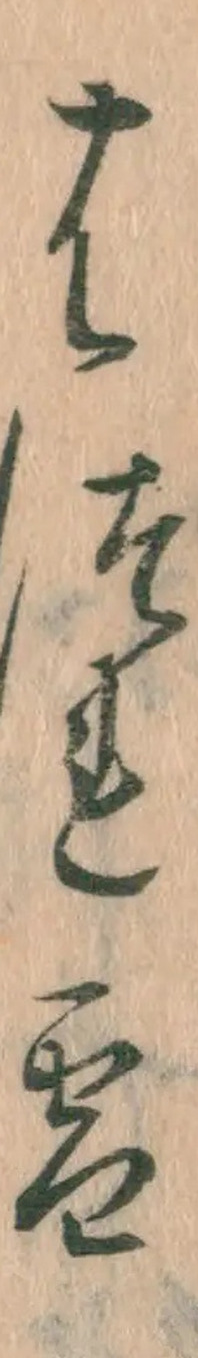はつれ雪
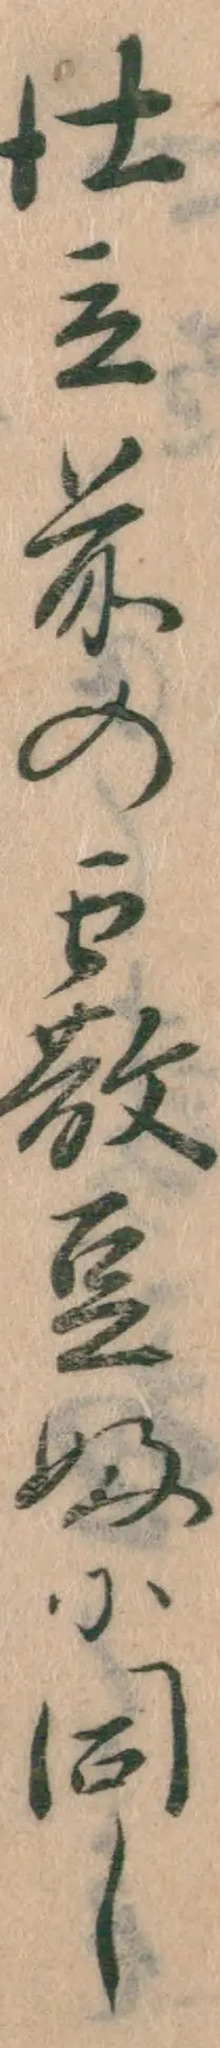仕立前の霰豆ふに同し
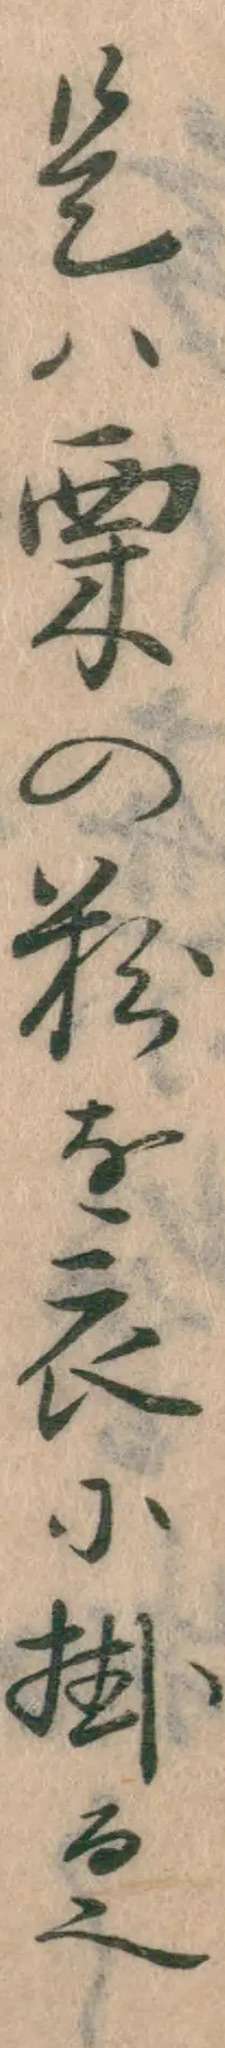是は栗の粉を衣に掛る也
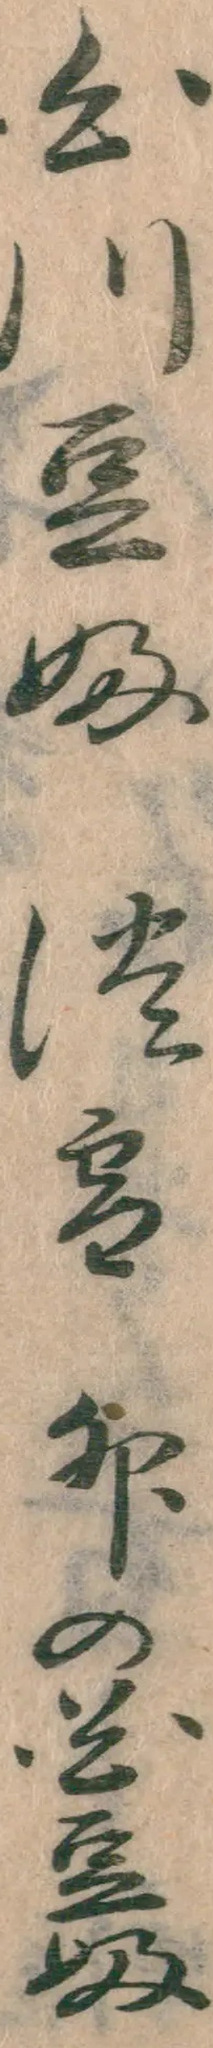白川豆ふ淡雪卯の花豆ふ
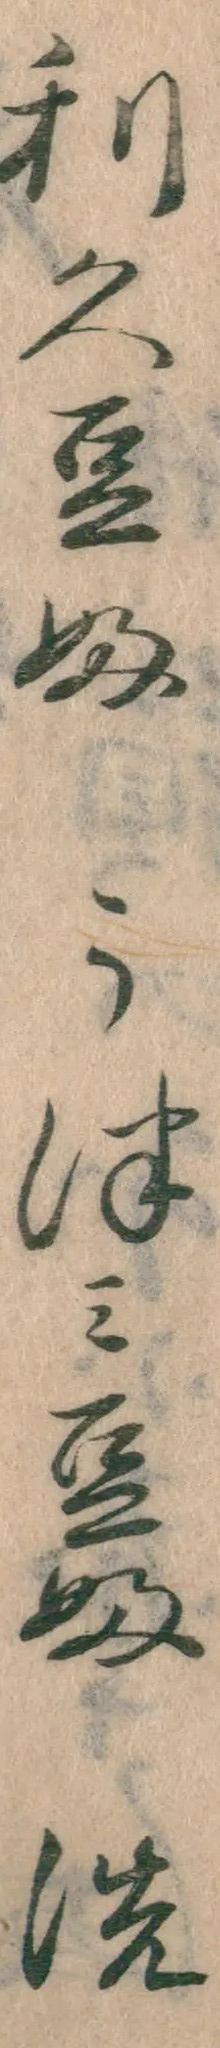利休豆ふうつみ豆ふ洗
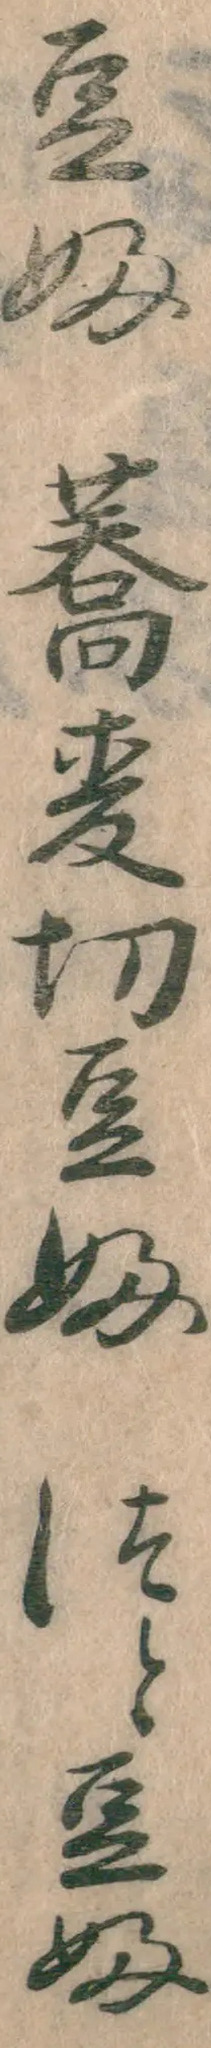豆ふ蕎麦切豆ふつと豆ふ
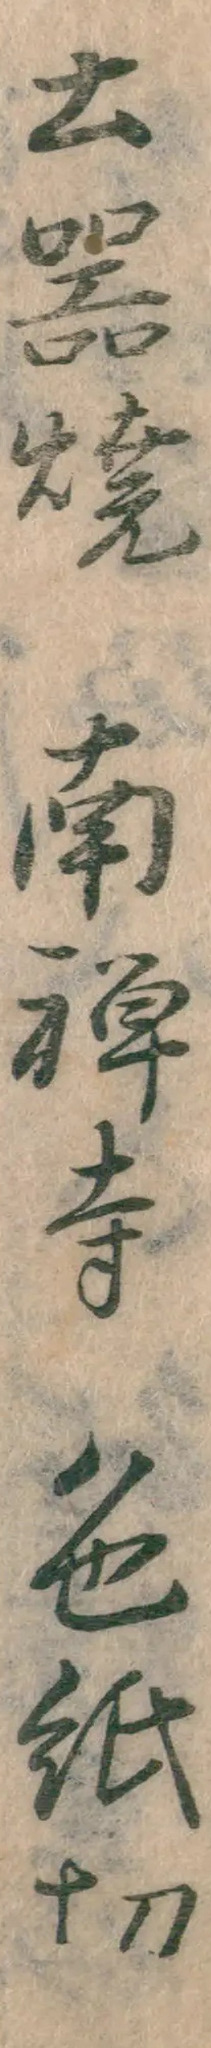土器焼南禅寺色紙切
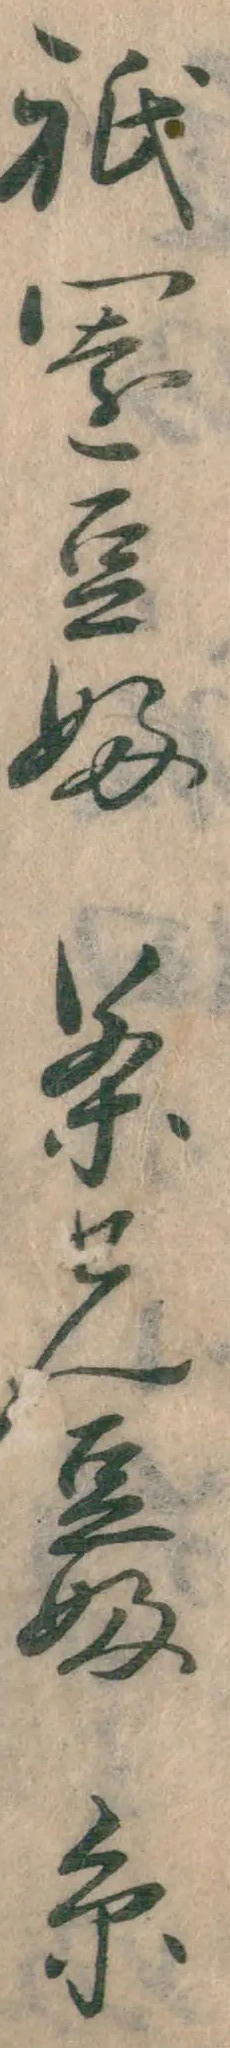祇園豆ふ茶せん豆ふ糸
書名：豆腐百珍余録
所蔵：国立国会図書館 National Diet Library, JAPAN
